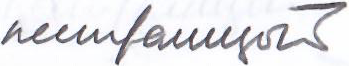пестролицый
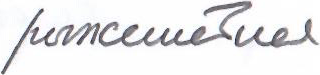рыжешейная
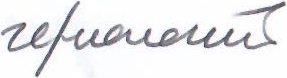черноногий
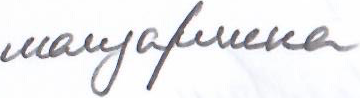мандаринка
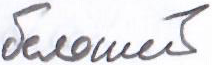белошей
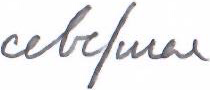северная
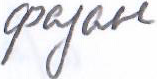фазан
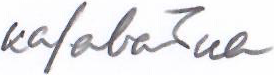каравайка
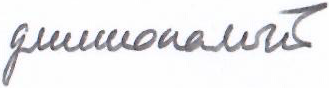длиннопалый
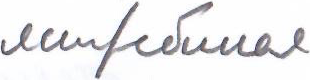ястребиная
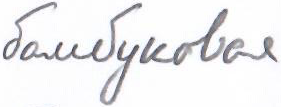бамбуковая
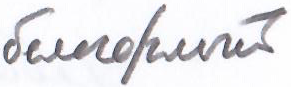белогорлый
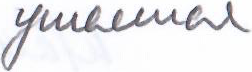ушастая
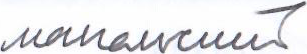монгольский
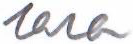гага
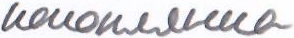коноплянка
